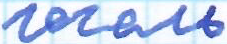гоголь
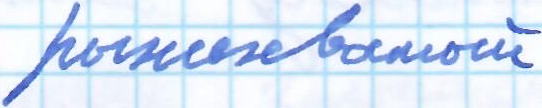рыжехвостый
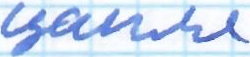цапля
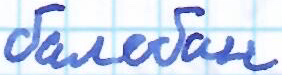балобан
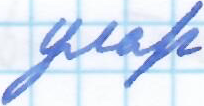улар
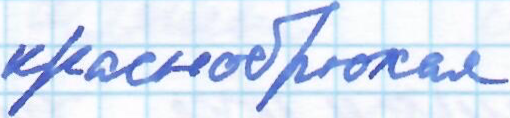краснобрюхая
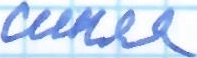синяя
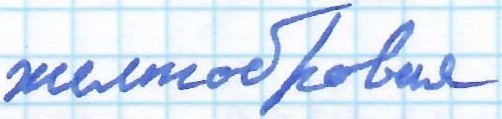желтобровая
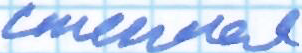степная
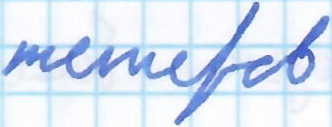тетерев
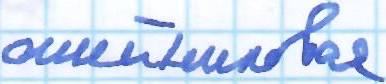ошейниковая
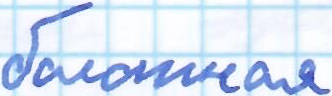болотная
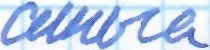синьга
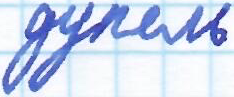дупель
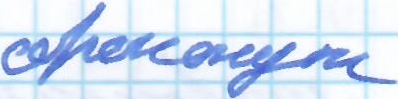сорокопут
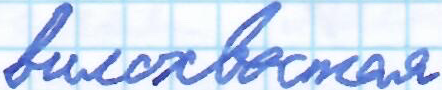вилохвостая
